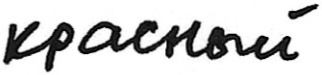красный
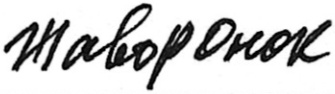жаворонок
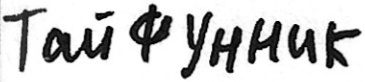тайфунник
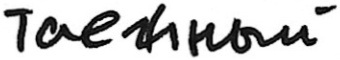таежный
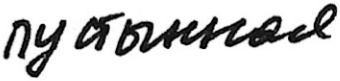пустынная
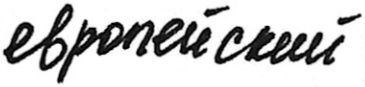европейский
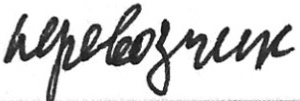перевозчик
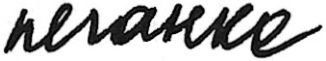пеганка
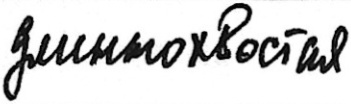длиннохвостая
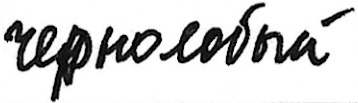чернолобый
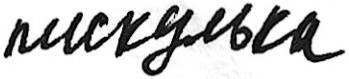пискулька
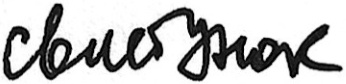свистунок
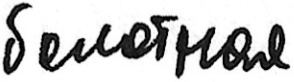болотная
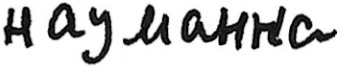науманна
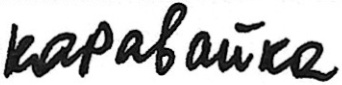каравайка
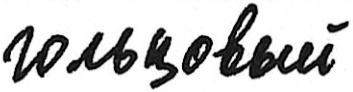гольцовый
